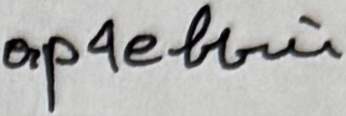арчевый
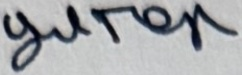дятол
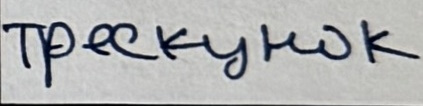трескунок
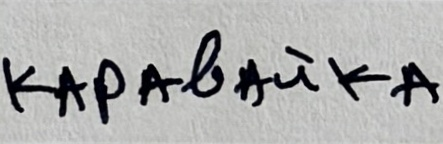каравайка
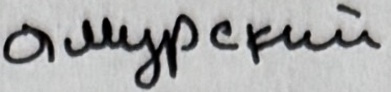амурский
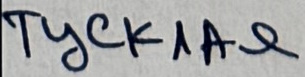тусклая
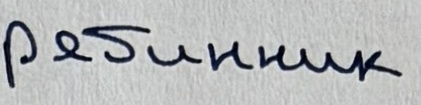рябинник
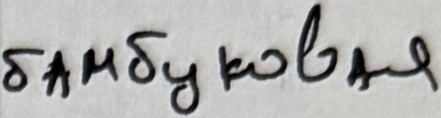бамбуковая
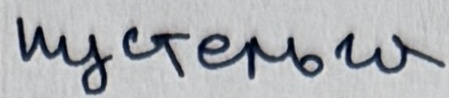пустельга
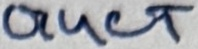аист
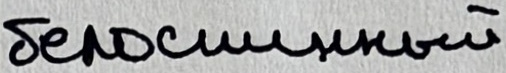белоспинный
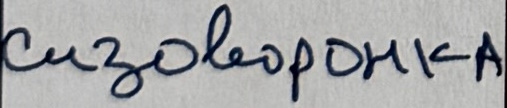сизоворонка
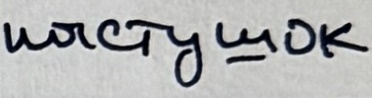пастушок
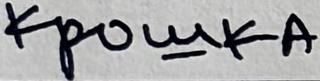крошка
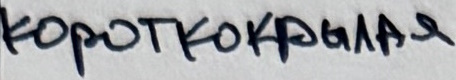короткокрылая
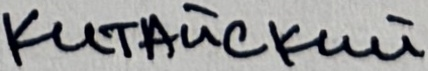китайский
